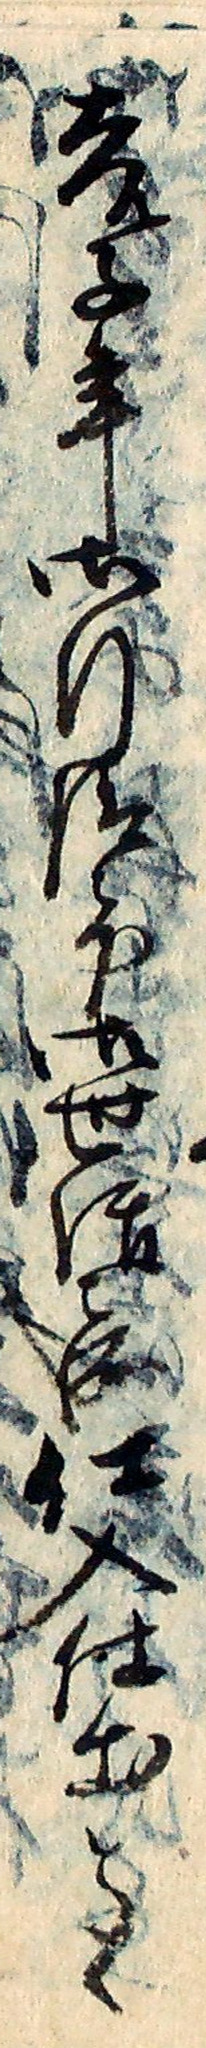去る子年御引請被下御世話被成仕入仕出とも
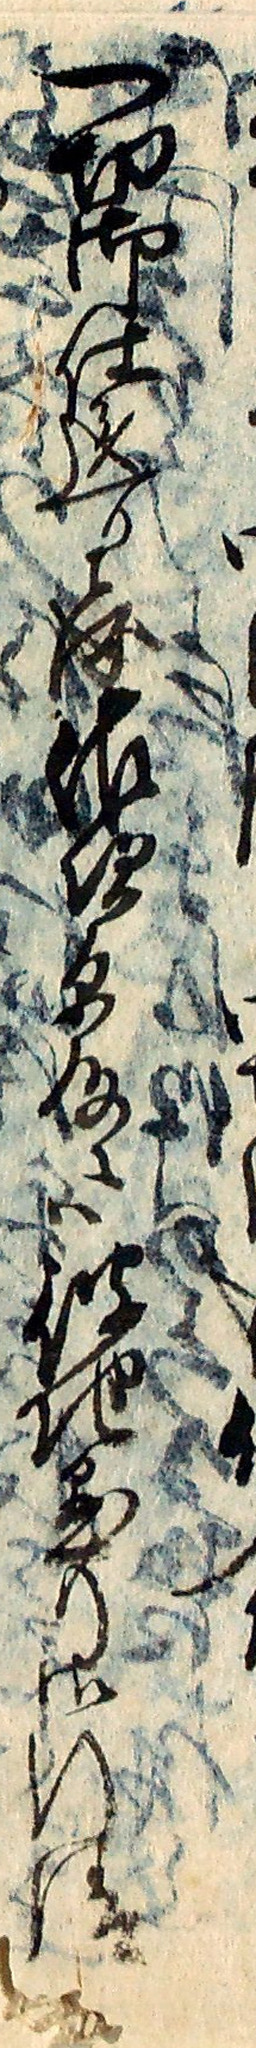一切御仕送り被成佐次兵衛殿には彼地懸引御引請
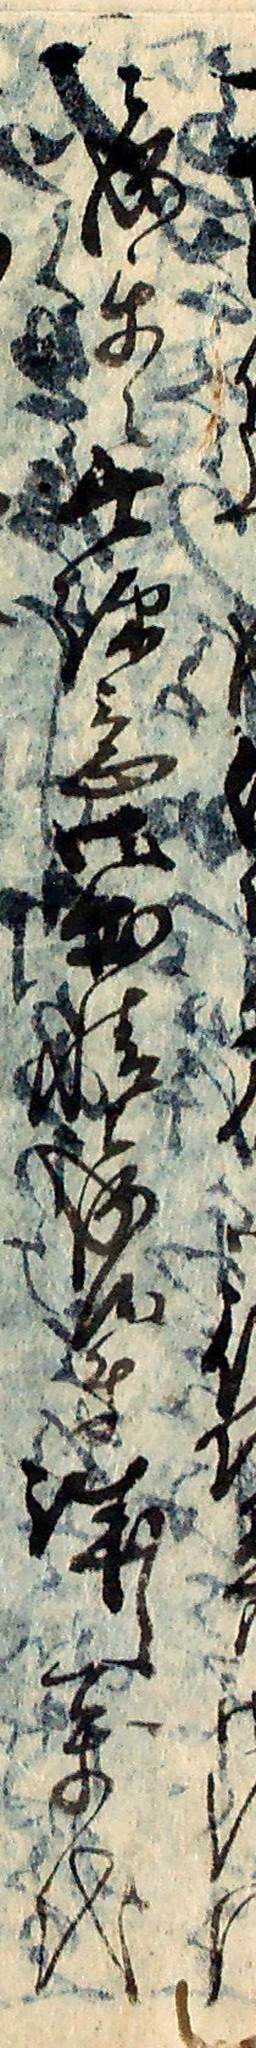被成互に無疎念御出情被成候に付誠に万代
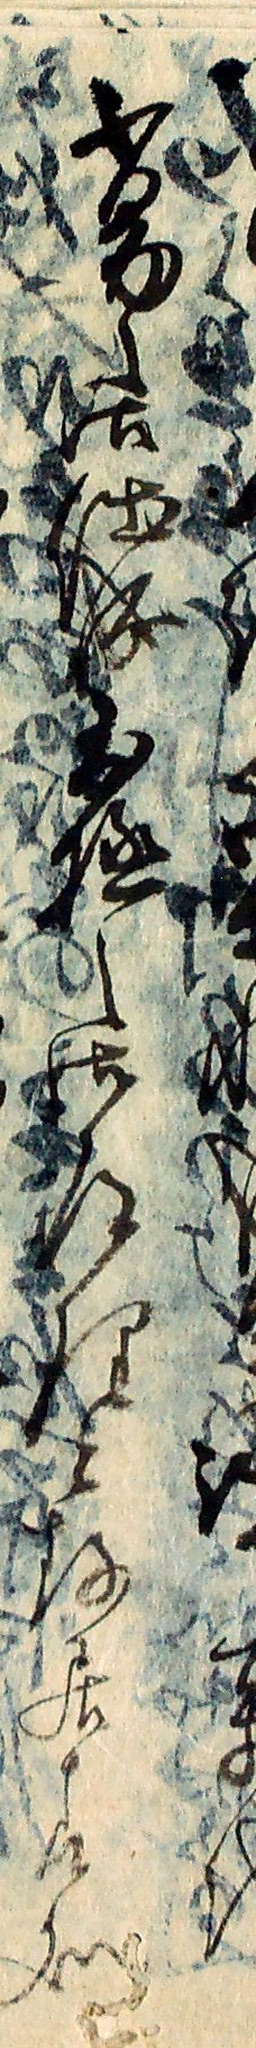不易之御仕成至極之御道理と存居申候処
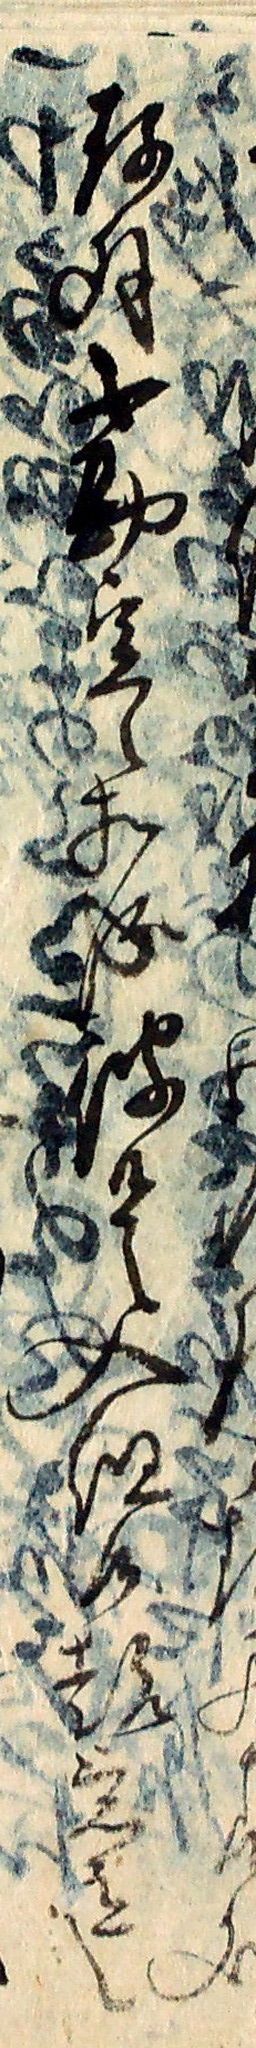存外不勘定に相成彼是入組候趣意有之
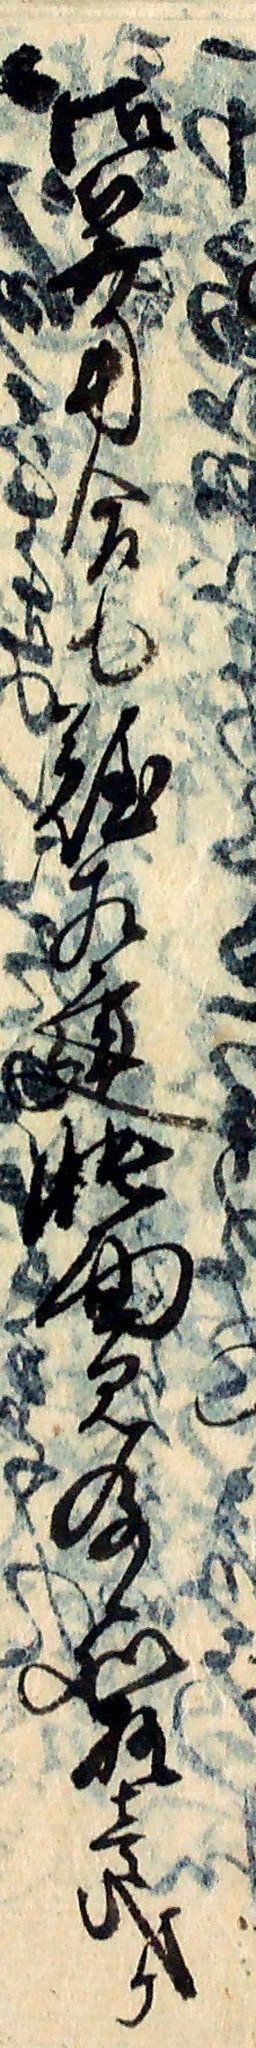御算用合も難相建帳面見及候処拾壱弐ヶ
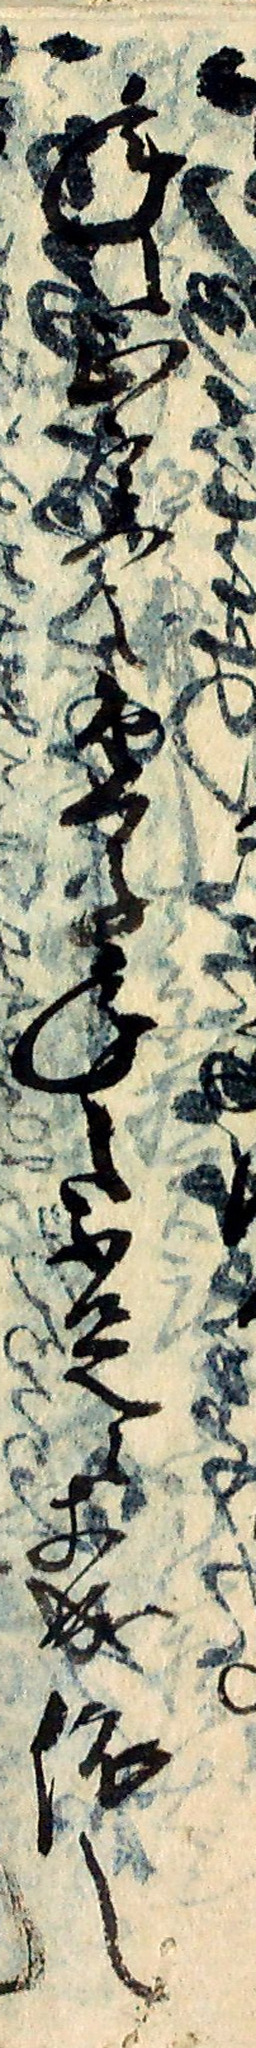年之正実之金子年々不足に相成依之
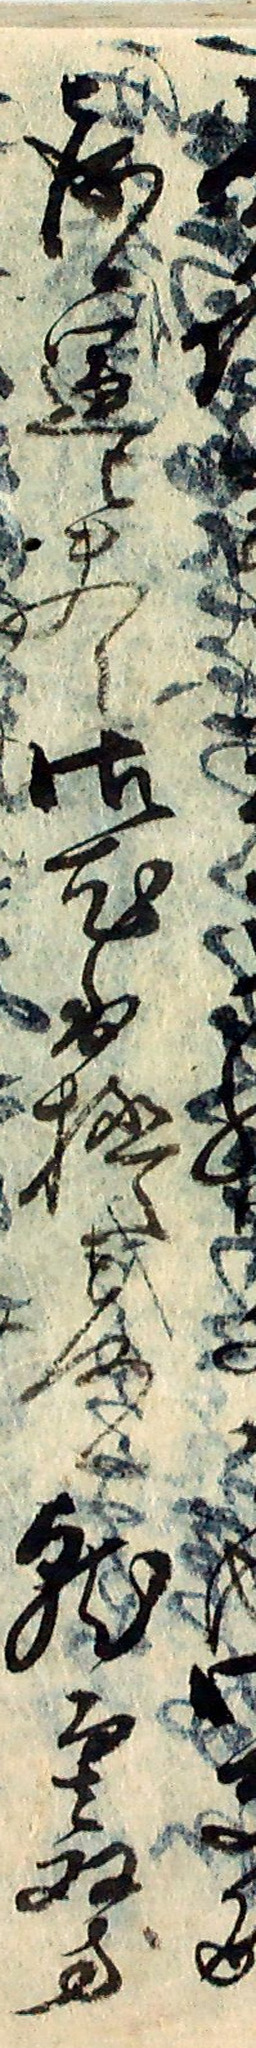被成候運ひ夫々御尤至極に奉存候就ては双方
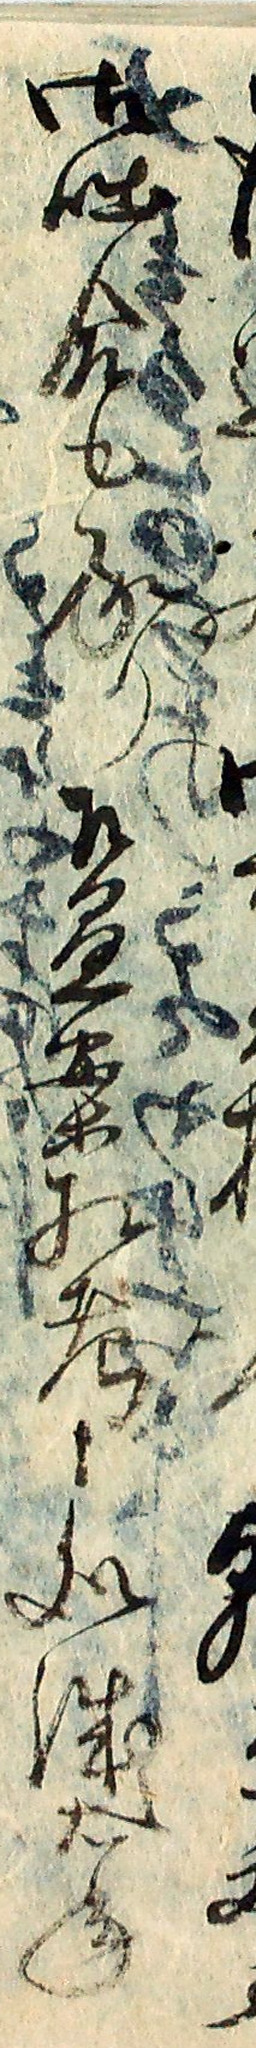御咄合も承り乍懸案相考申処誠右年
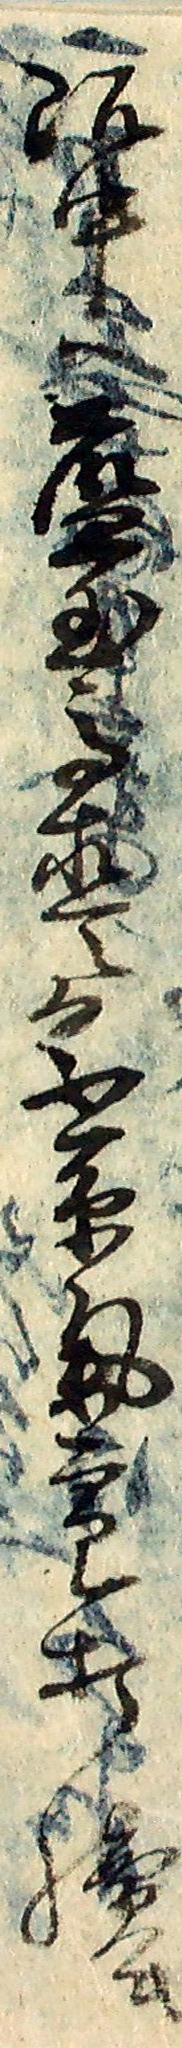限中へ藍玉高直にて不景気而已打続き
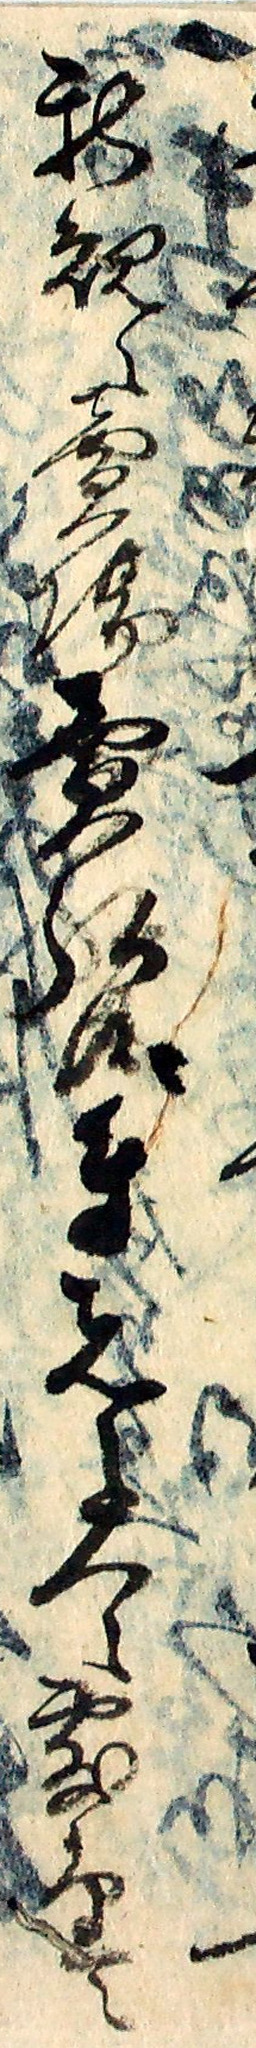新規之売場売弘候に付先々大に寄金に

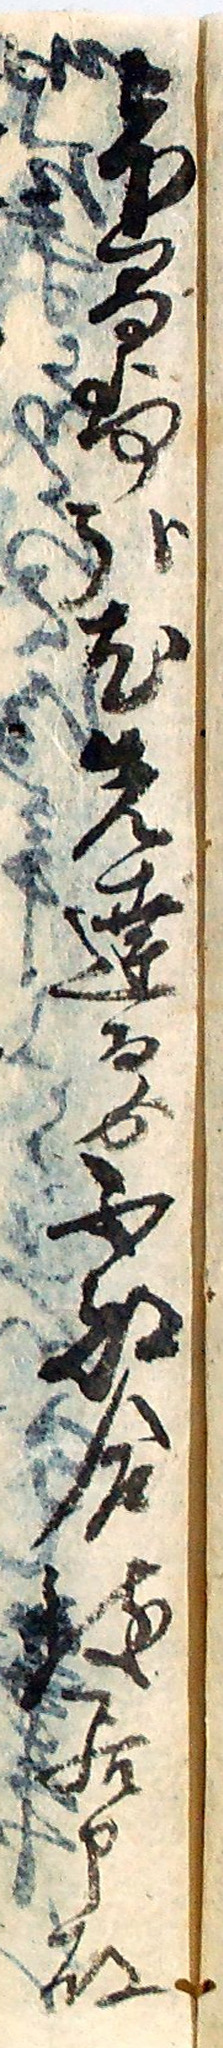被下間布哉尤先達てゟ不都合致居申故
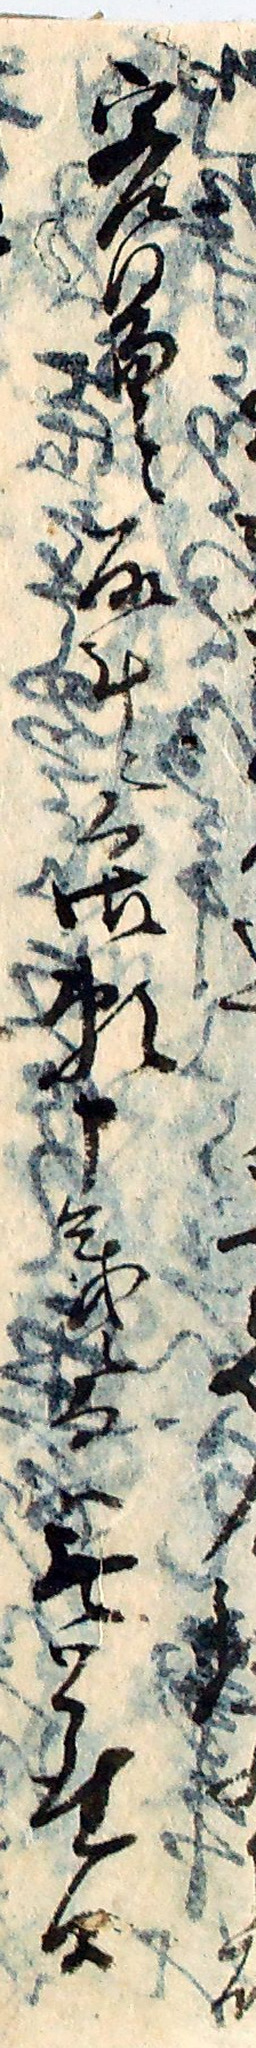容易之取計にて御願申義にては無御座候
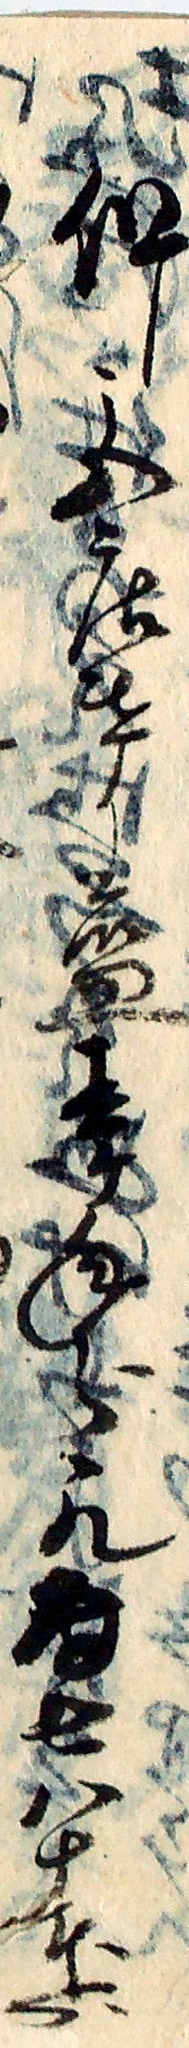但し宮居遣い藍壱ヶ年分凡百七八十本ゟ
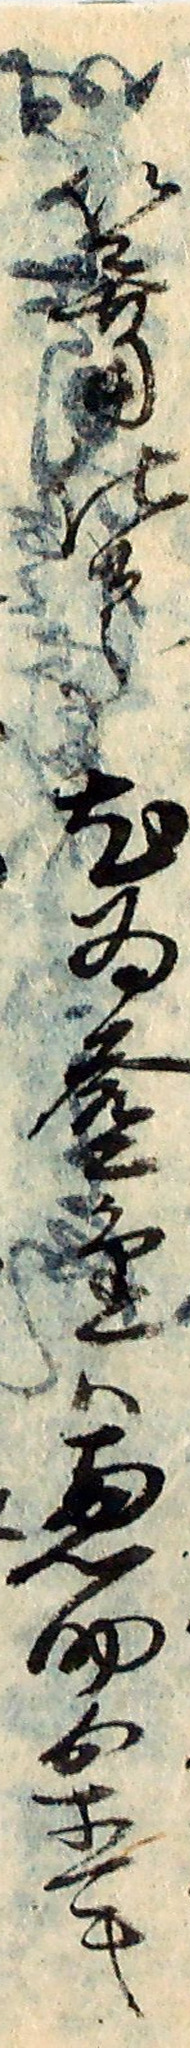算用仕候事尤為登金は恵助ゟ直き
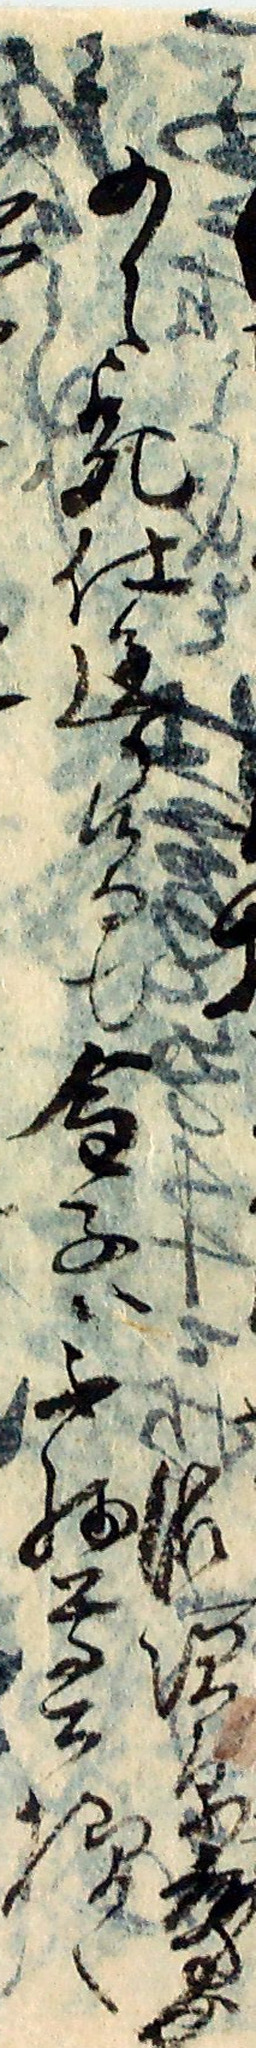のし宛仕送り候ても金子は不残尊公様へ
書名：諸御願書控(後藤氏壱番）
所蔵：鳴門教育大学 Naruto University of Education
